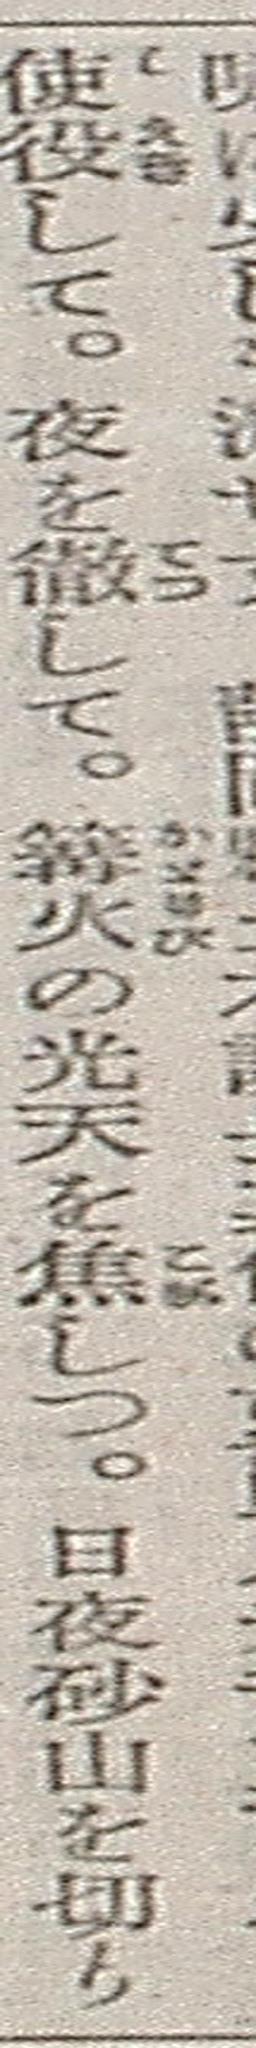使役して。夜を徹して。篝火の光天を焦しつ。日夜砂山を切り
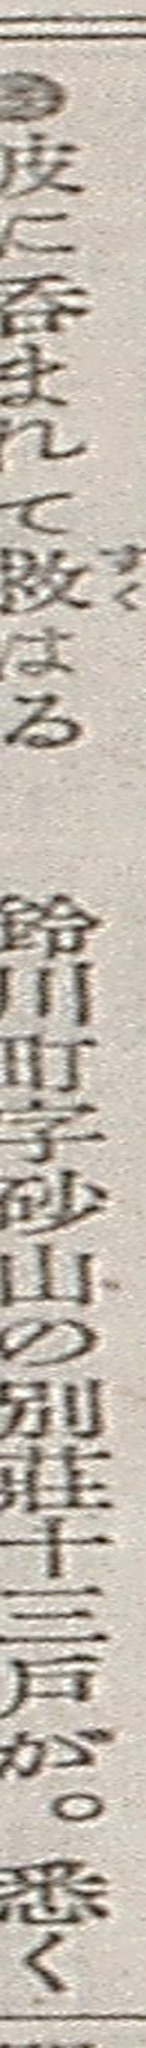●波に呑まれて救はる鈴川町字砂山の別荘十三戸が。悉く
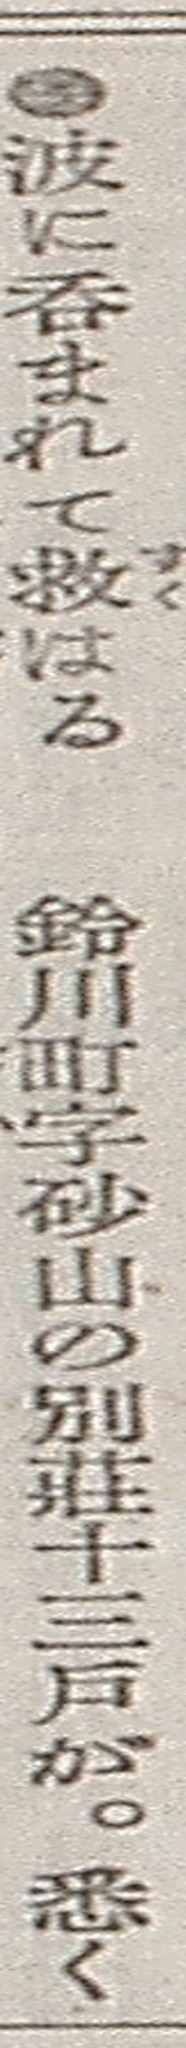●波に呑まれて救はる鈴川町字砂山の別荘十三戸が。悉く
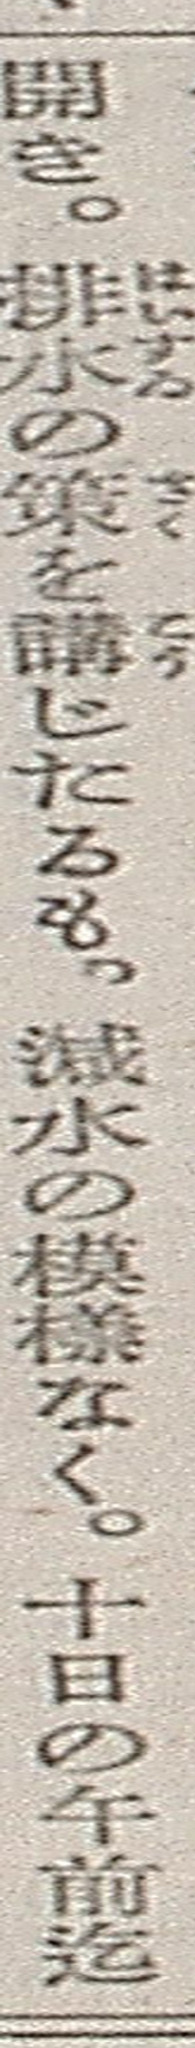開き。排水の策を講じたるも。減水の模様なく。十日の午前迄
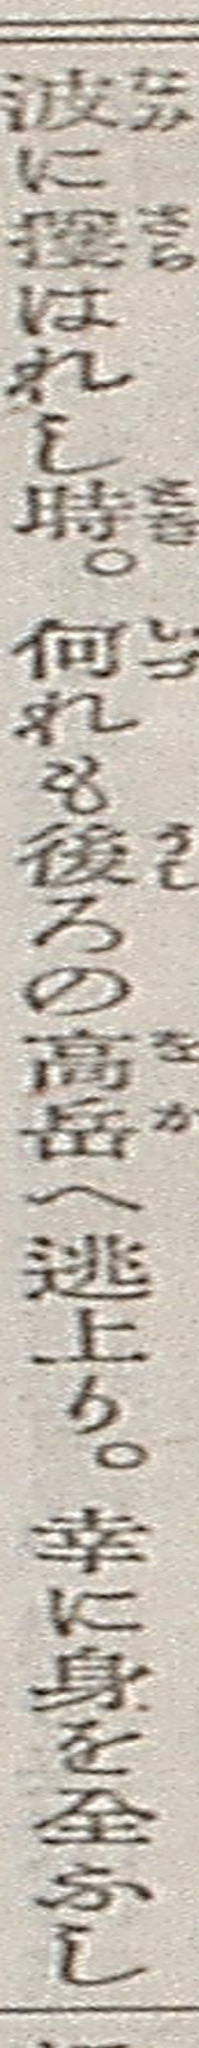波に攫はれし時。何れも後ろの高岳へ逃上り。幸に身を全ふし
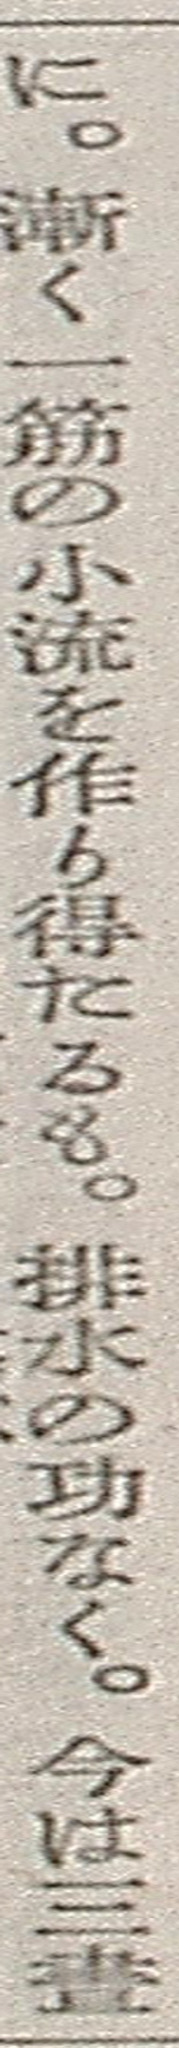に。漸く一筋の小流を作り得たるも。排水の功なく。今は三昼
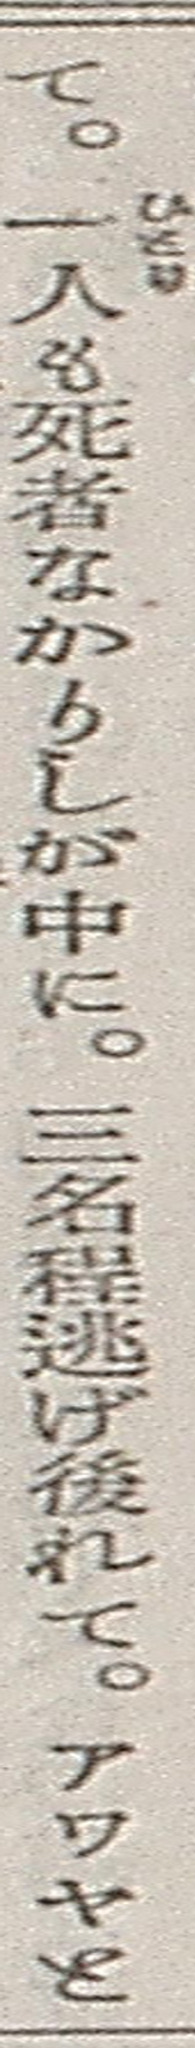て。一人も死者なかりしが中に。三名程逃げ後れて。アワヤと
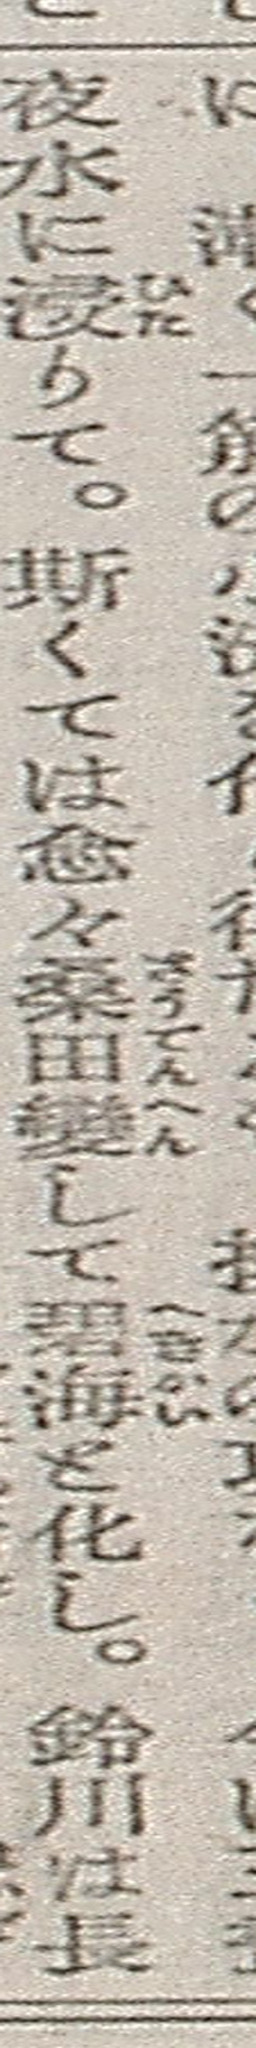夜水に浸りて。斯くては愈々桑田変して碧海と化し。鈴川は長
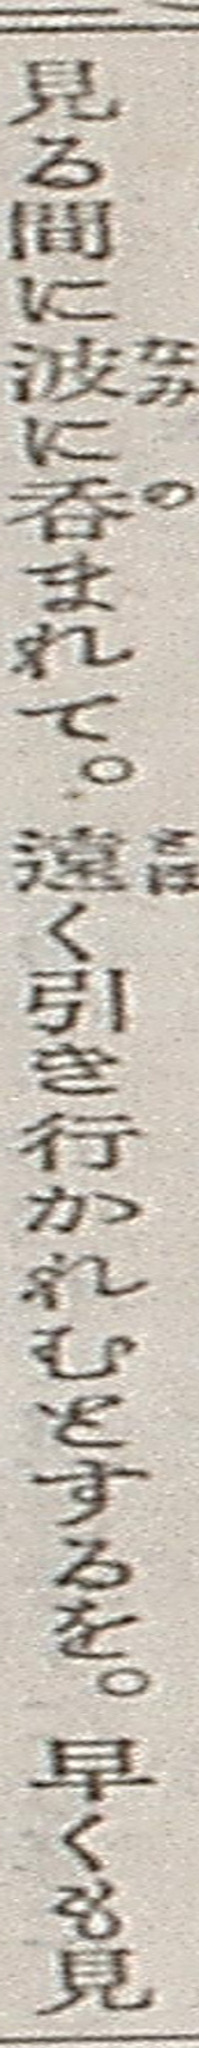見る間に波に呑まれて。遠く引き行かれむとするを。早くも見
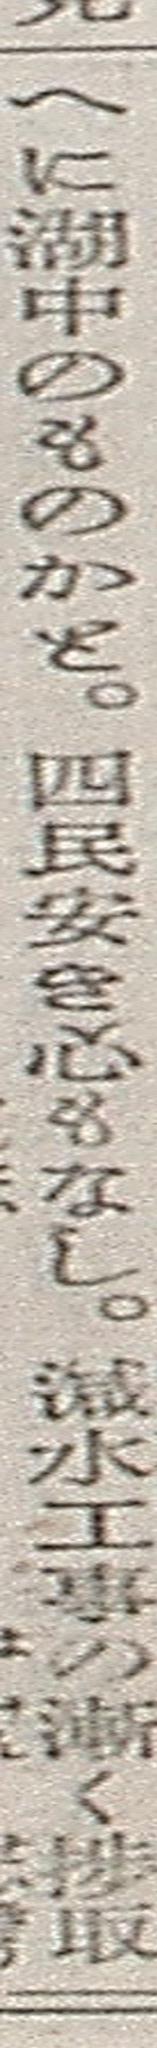へに湖中のものかと。四民安き心もなし。減水工事の漸く捗取
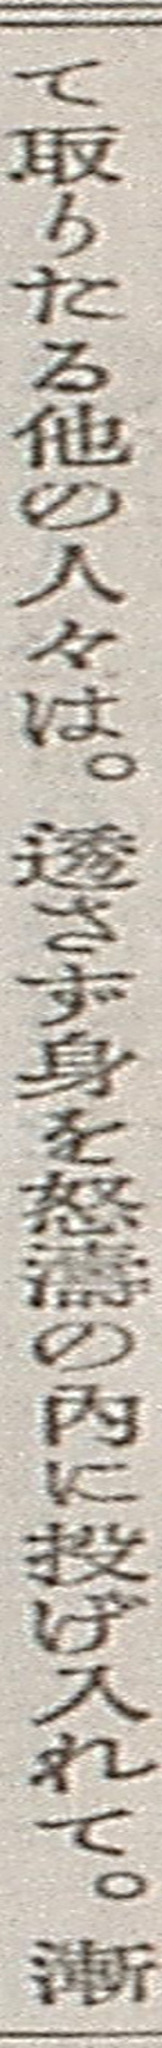て取りたる他の人々は。透さず身を怒濤の内に投げ入れて。漸
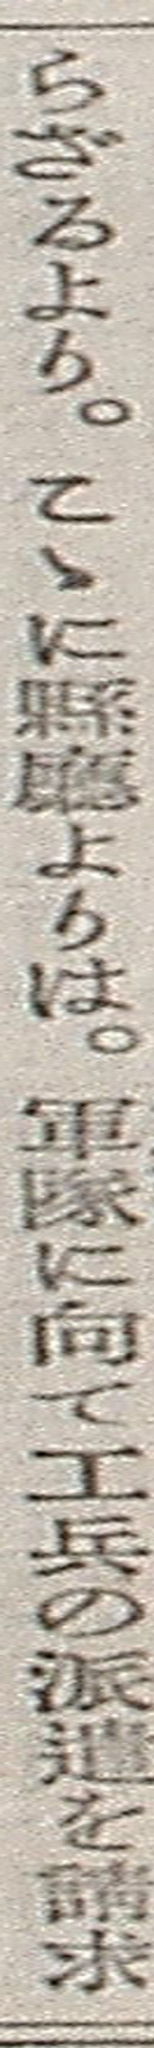らざるより。こゝに県庁よりは。軍隊に向て工兵の派遣を請求
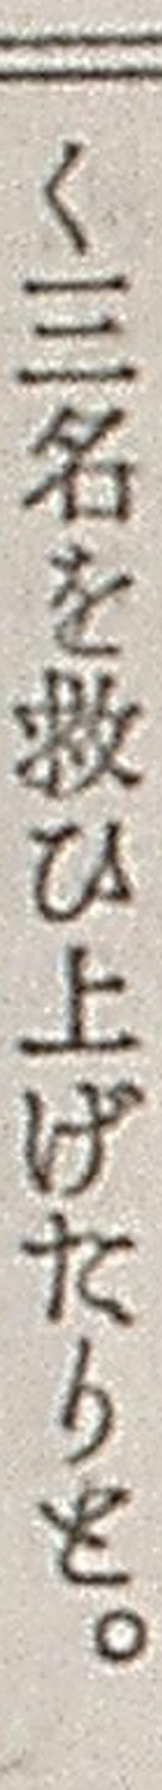く三名を救ひ上げたりと。
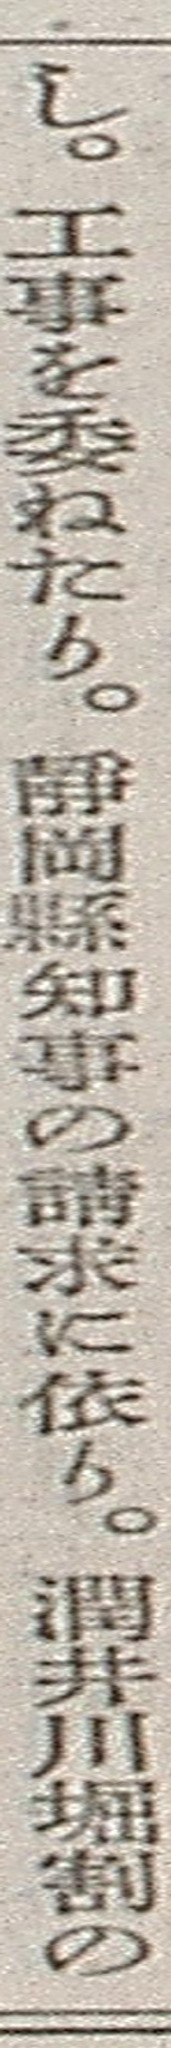し。工事を委ねたり。静岡県知事の請求に依り。潤井川堀割の
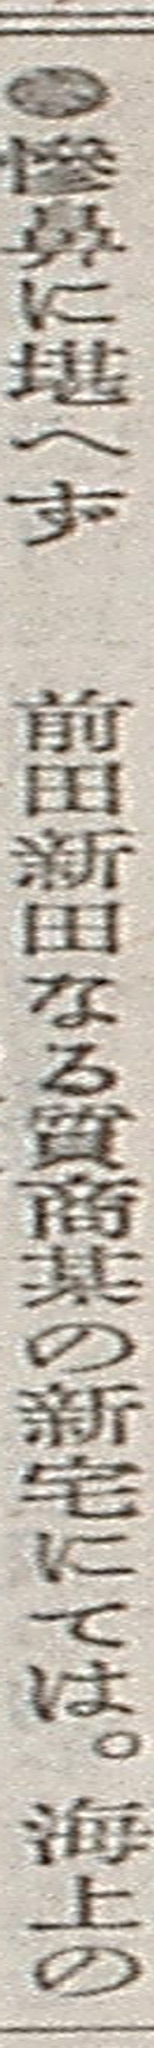●惨鼻に堪へず前田新田なる質商某の新宅にては。海上の
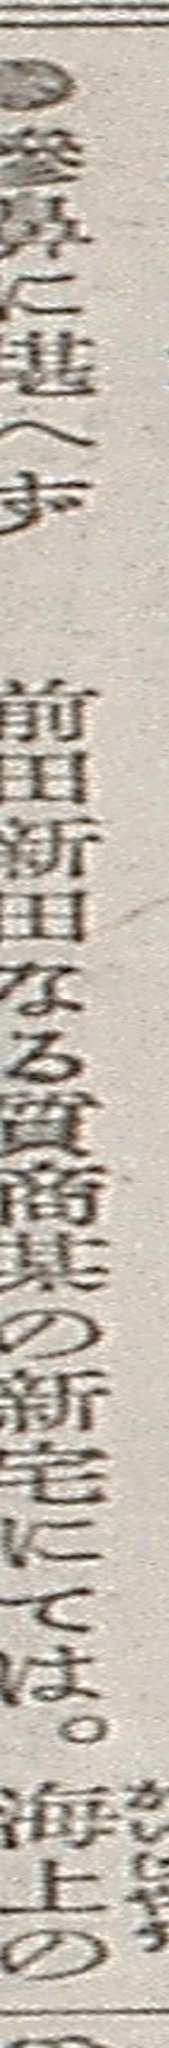●惨鼻に堪へず前田新田なる質商某の新宅にては。海上の
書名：風俗畫報臨時増刊第百九十九號　明治三十二年十月各地災害圖會（前編之續）
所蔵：東京大学地震研究所図書室 Earthquake Research Institute Library, The University of Tokyo, JAPAN
